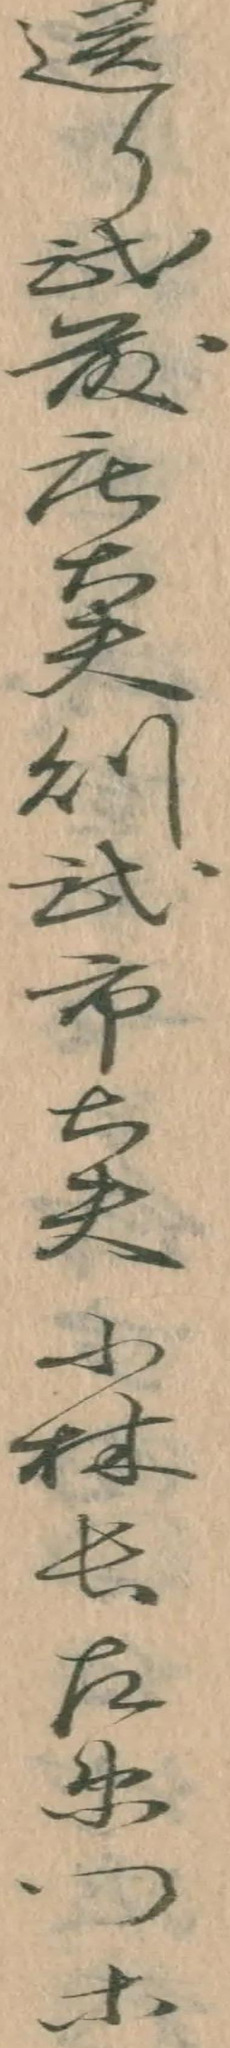送り武藤庄大夫則武市大夫小林長左衛門等
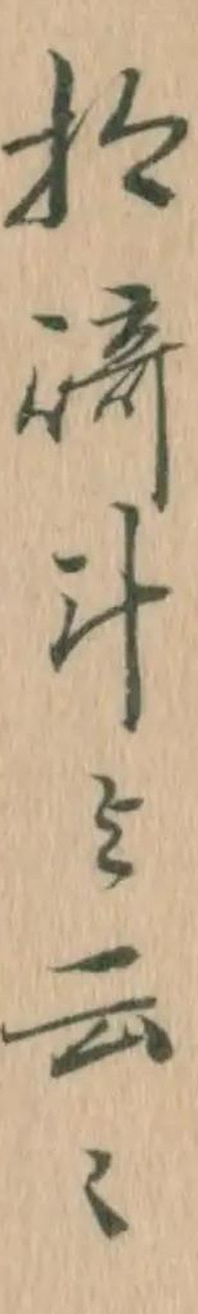拾崎斗と云々

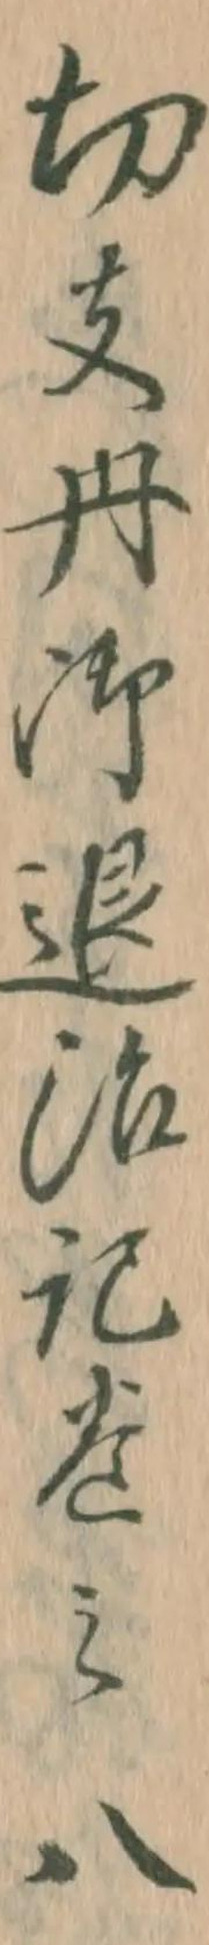切支丹御退治記巻之八
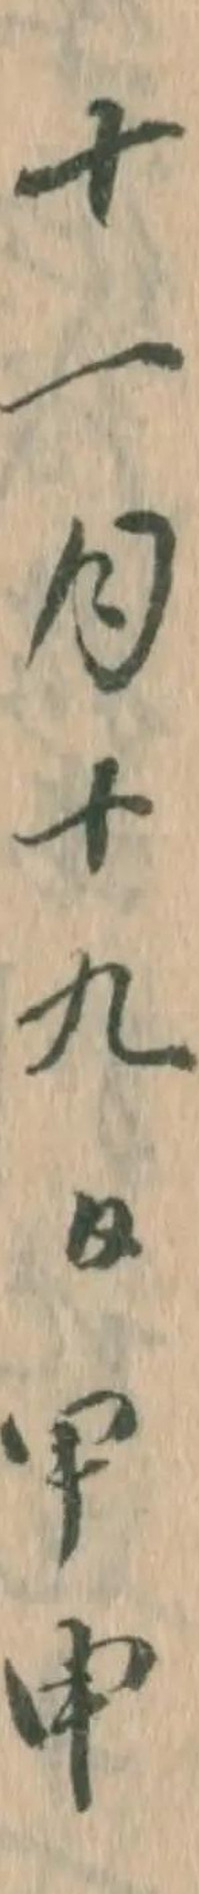十一月十九日甲申
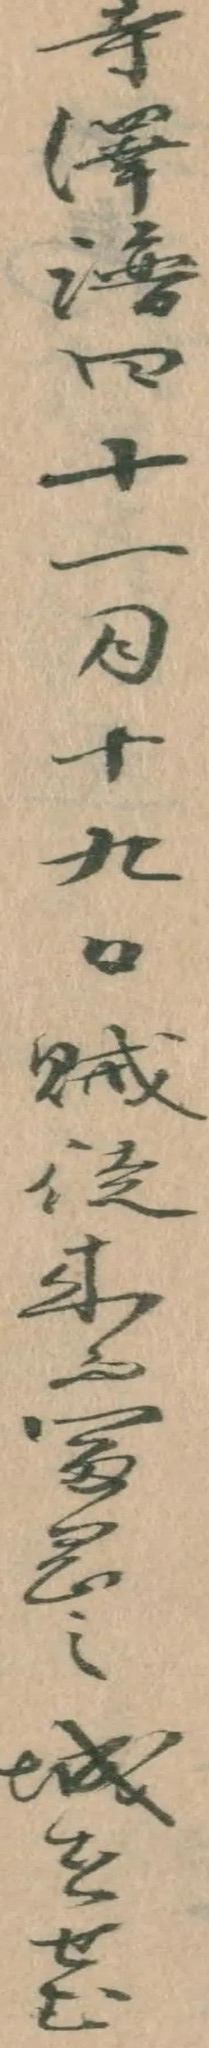寺沢譜曰十一月十九日賊徒来而富岡之城をせむ
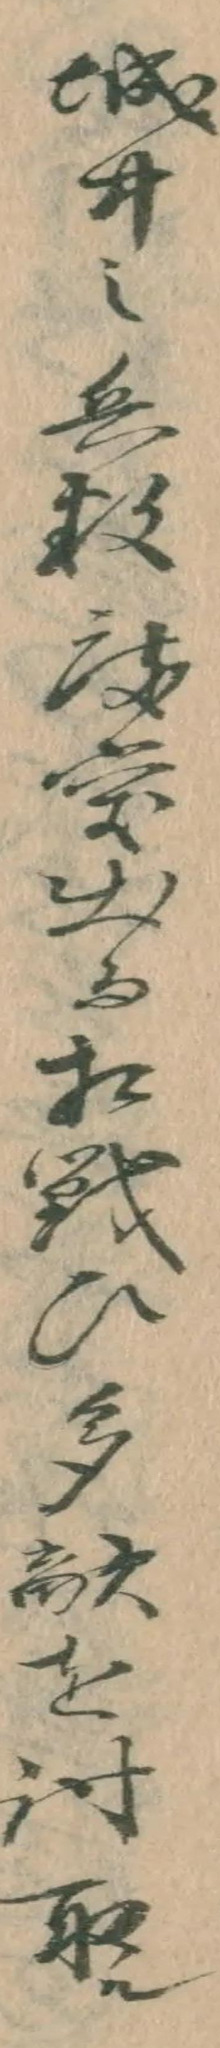城中之兵数度突出而相戦ひ多敵を討取ル
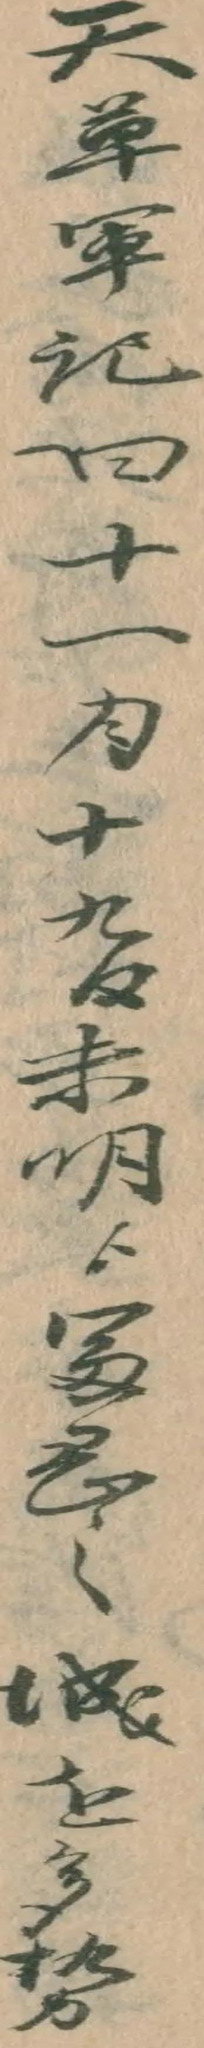天草軍記曰十一月十九日未明ゟ富岡之城を多勢
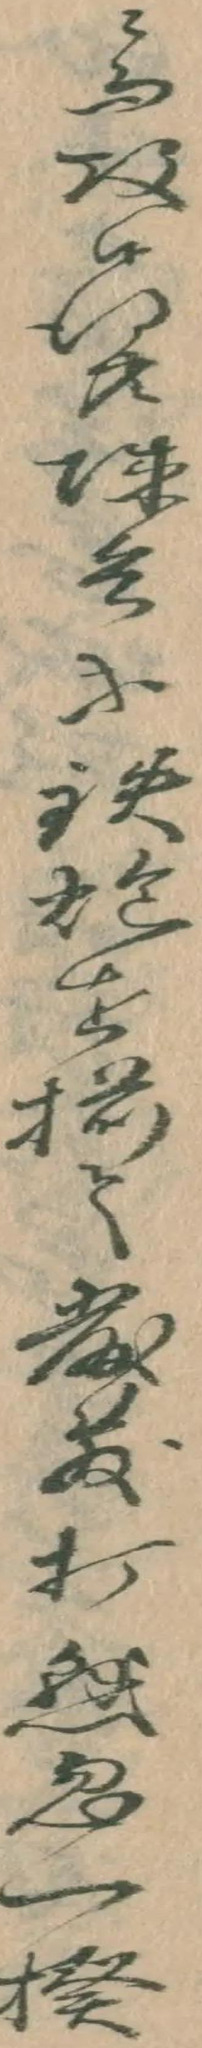に而攻候得共城兵等鉄炮を揃て厳敷打懸忽一揆
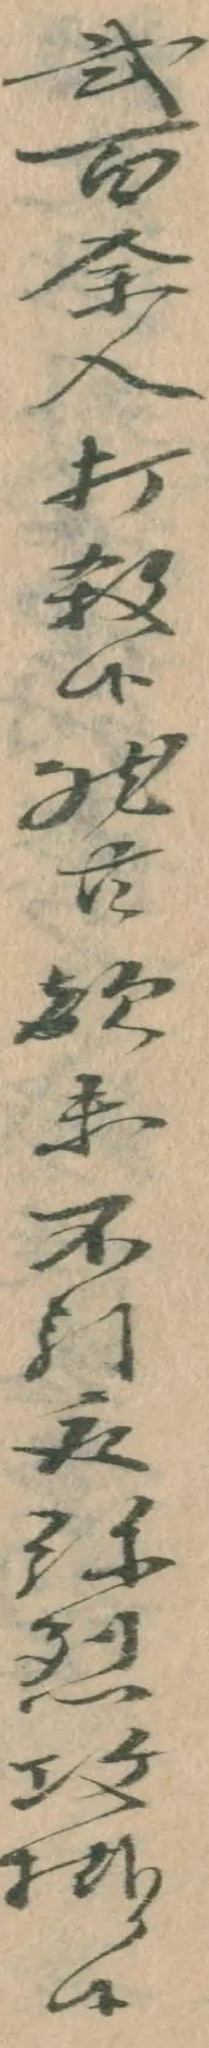弐百余人打殺候然共敵未不引取弥烈攻掛り候
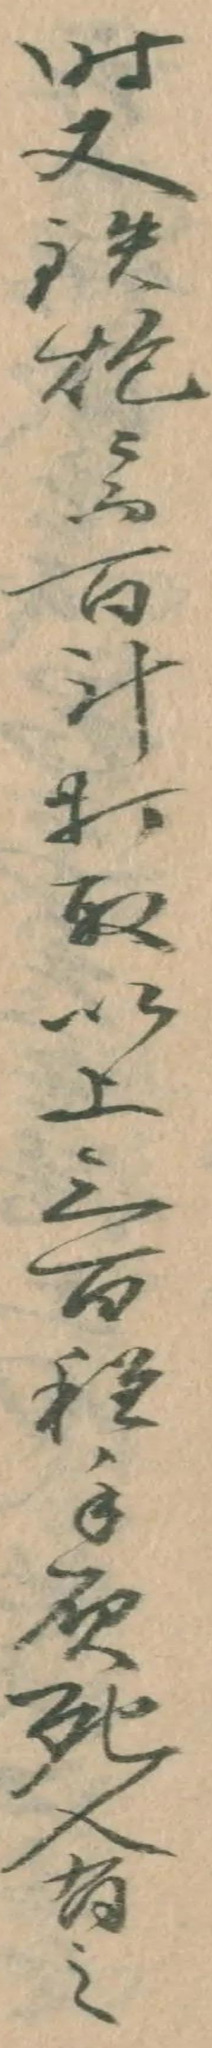時又鉄炮に而百斗打取以上三百程手負死人有之
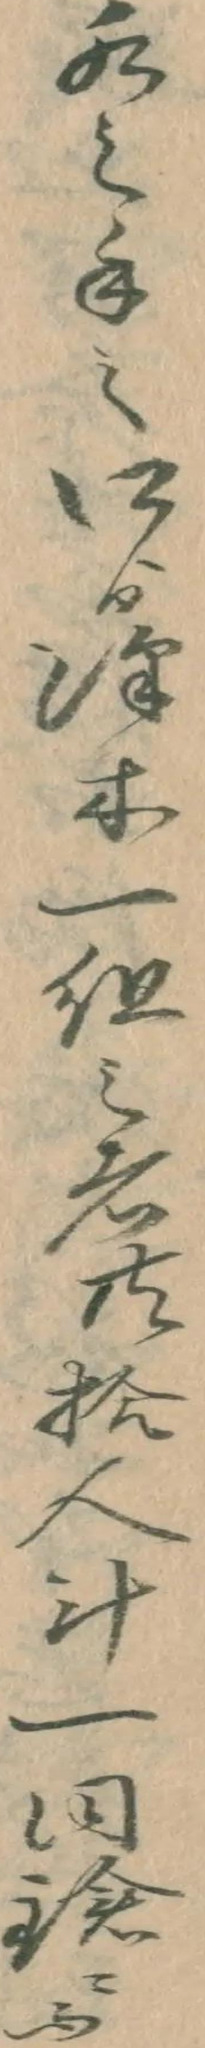水之手之口ゟ沢木一組之者共拾人斗一同槍に而

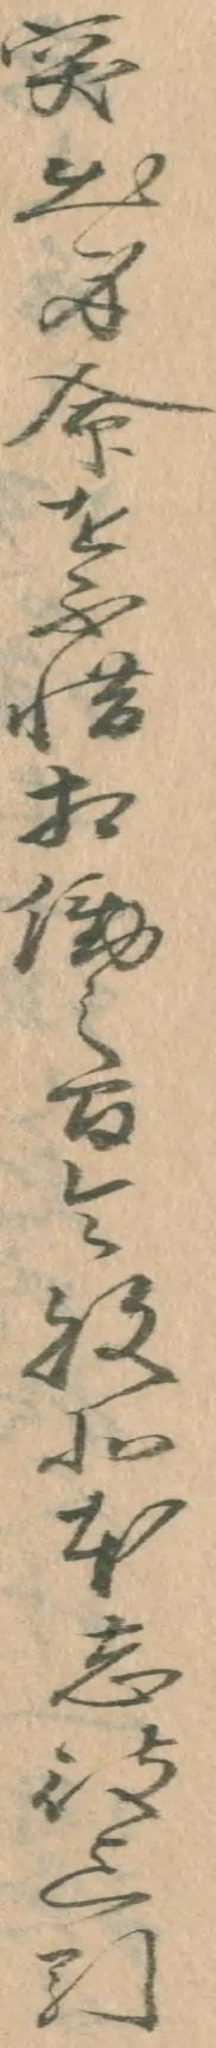突出身命を不惜相働之間令致和本志岐迄引
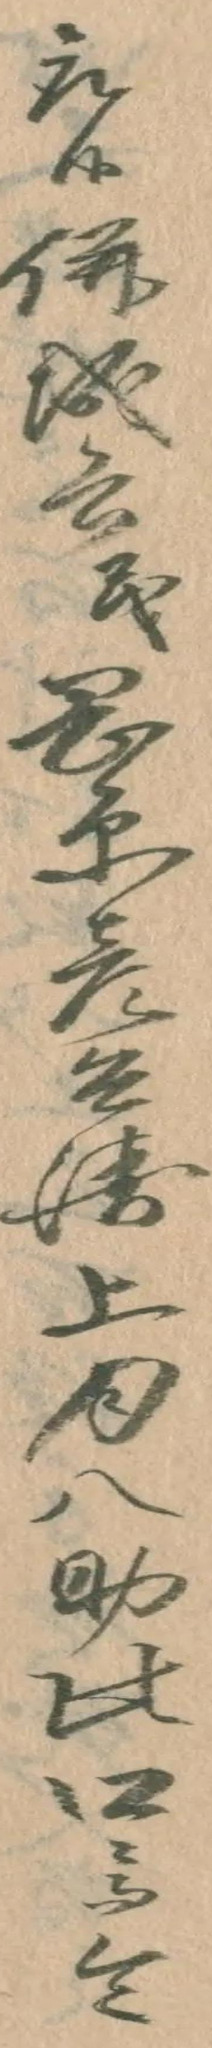取候併城兵義岡原彦兵衛上月八助此口に而令
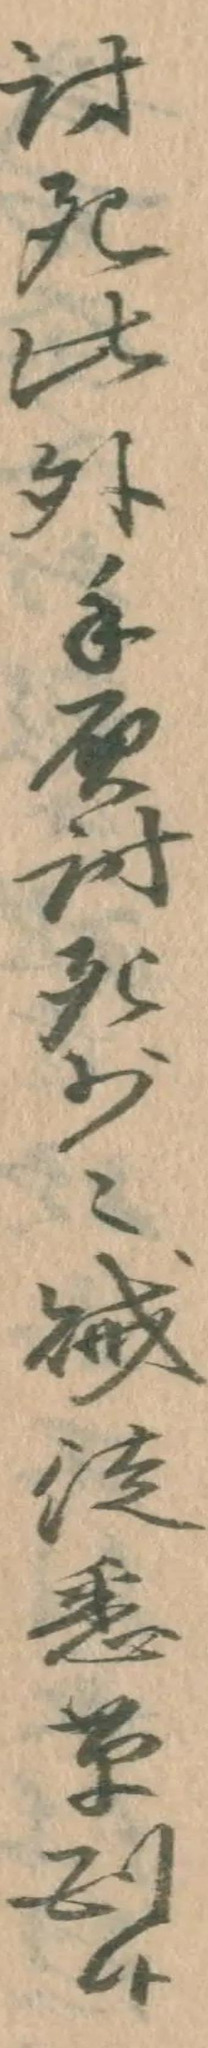討死此外手負討死少々賊徒悉草刈候
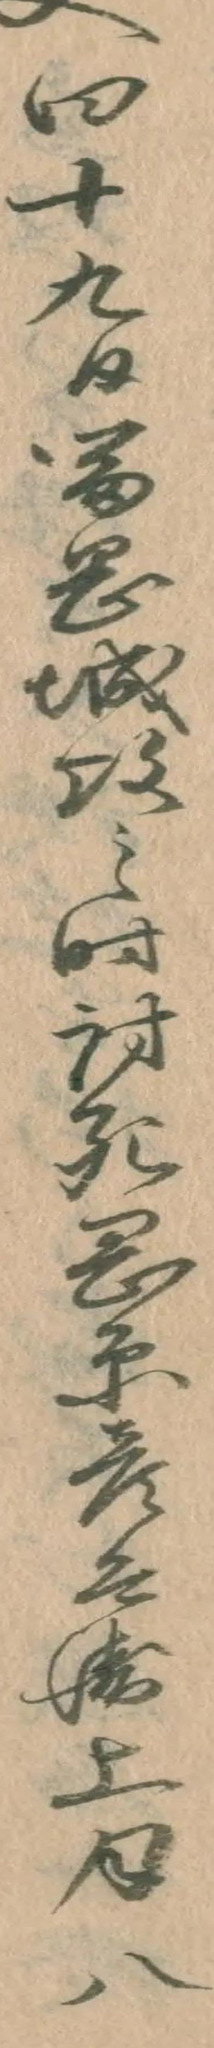又曰十九日富岡城攻之時討死岡原彦兵衛上月八
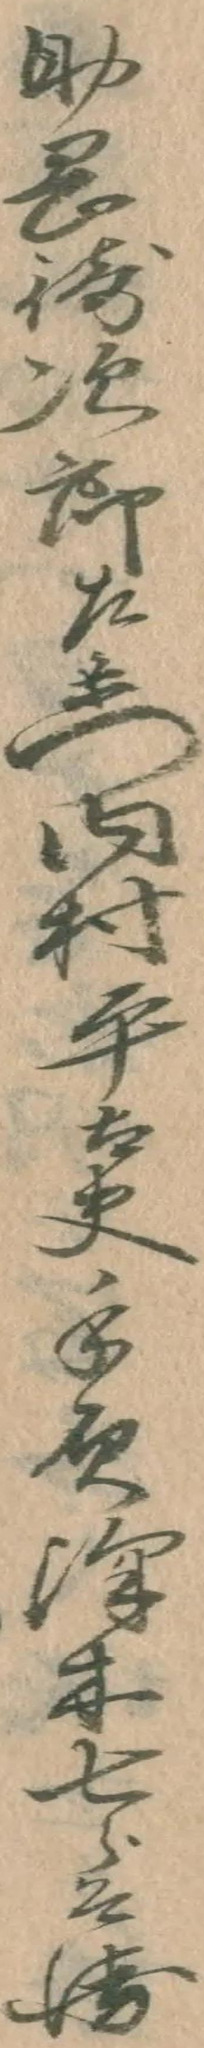助岡崎次郎左衛門内村平太夫手負沢木七郎兵衛
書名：切支丹御退治記 49巻. [3]
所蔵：国立国会図書館 National Diet Library, JAPAN
